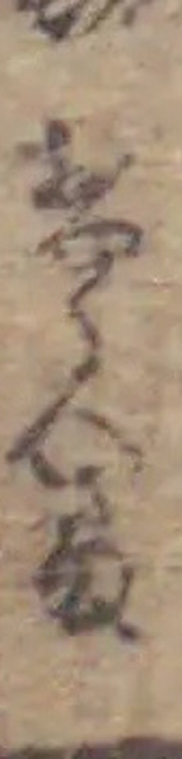おやく人さま
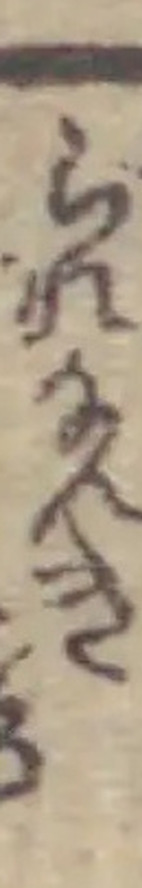られなんきする
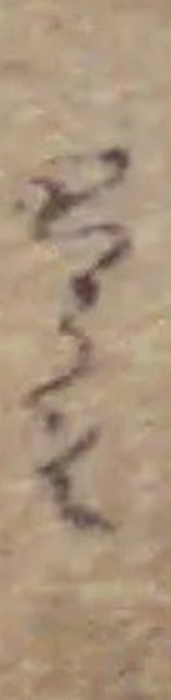とうそ
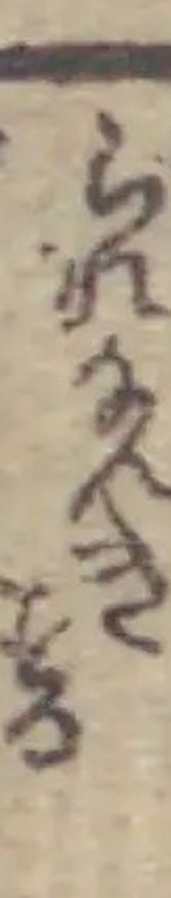られなんきする
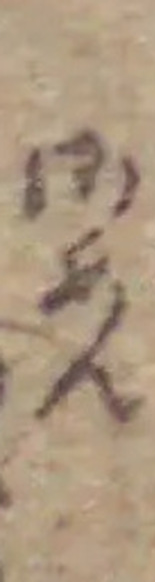御めん
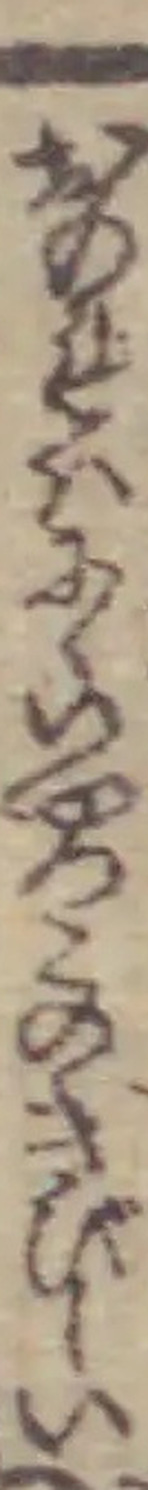おのれはにくいやつこのきびしい
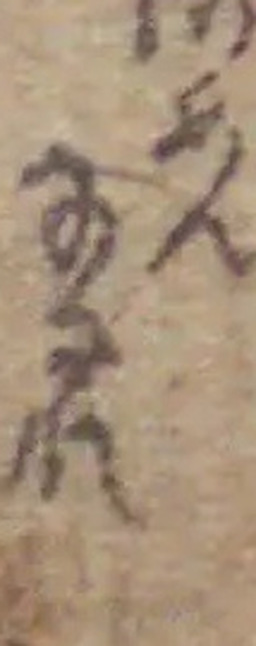なされ
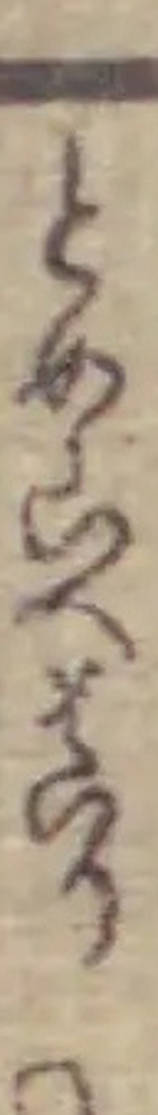とめ山へはいり
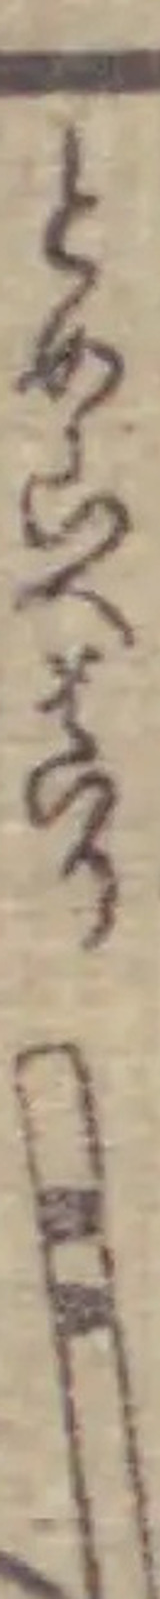とめ山へはいり
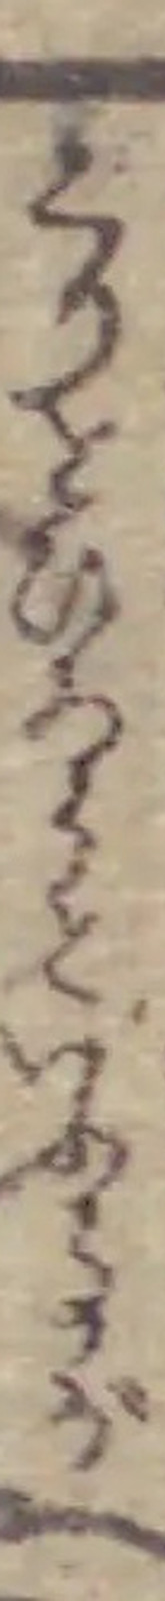くりをひろうといふ事が
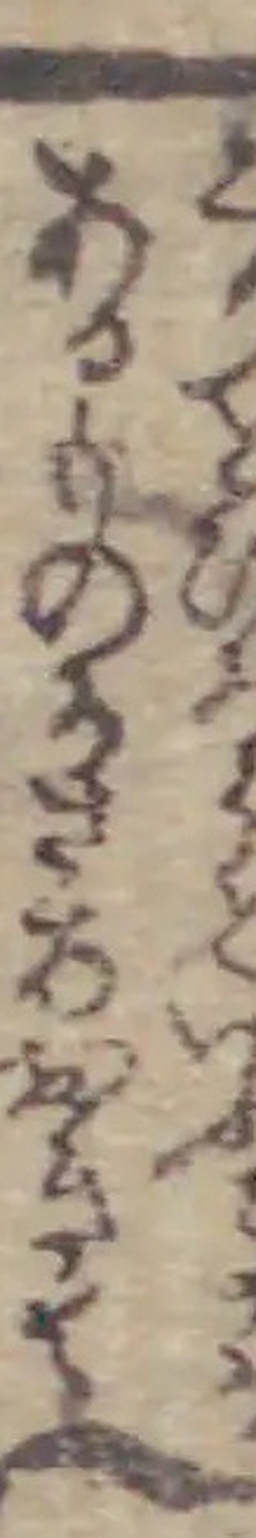あるものかさあおきて
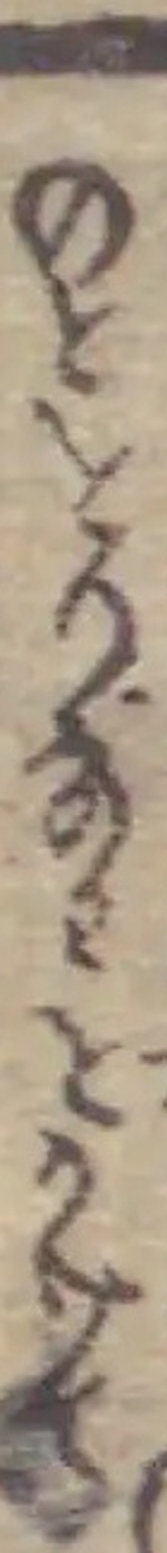のとをりなわをうけて
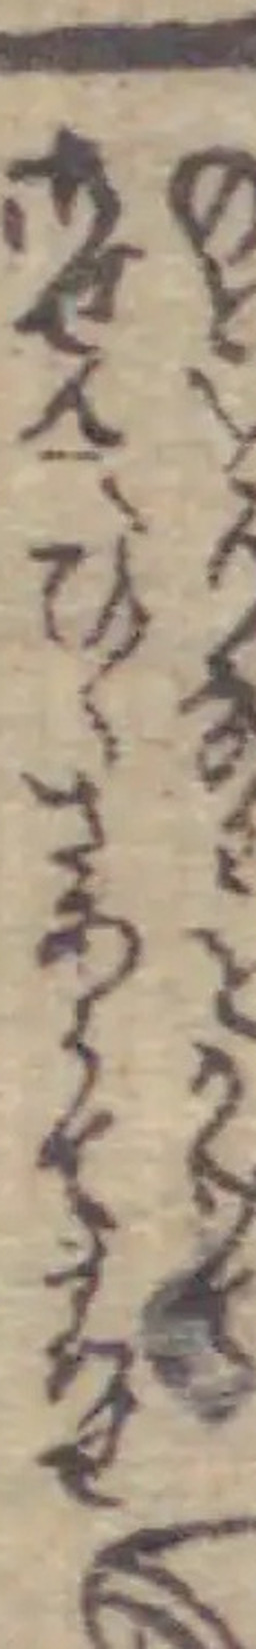御せんへひくさあうてまはせ
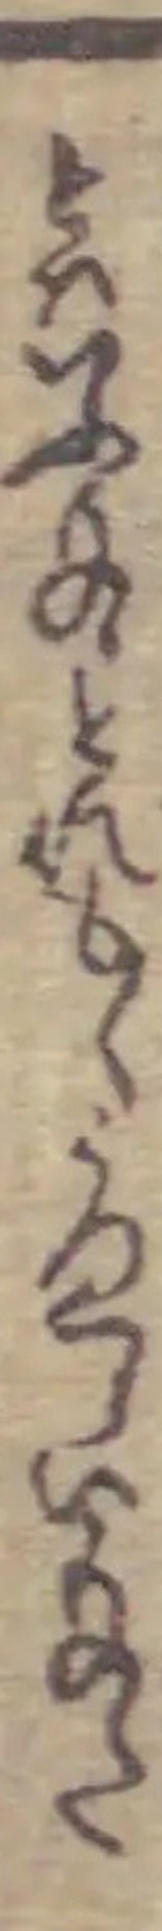とはいふものゝとれも〳〵うつくしいものた

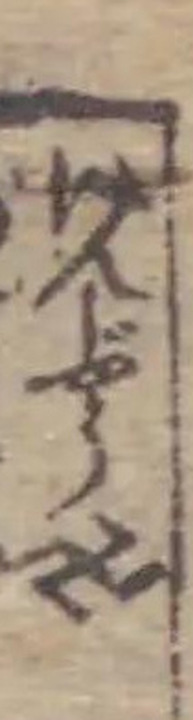けんじやう
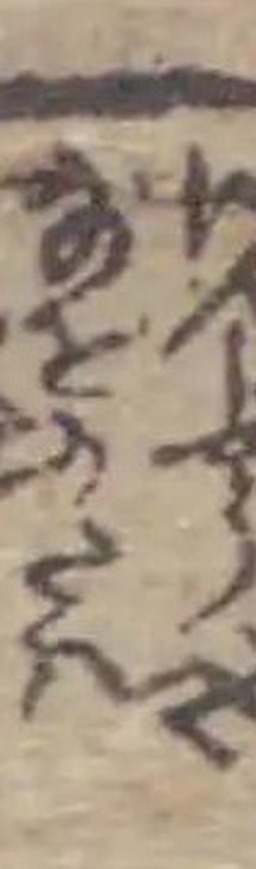なをかたは
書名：奥州咄 3巻
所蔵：国立国会図書館 National Diet Library, JAPAN
